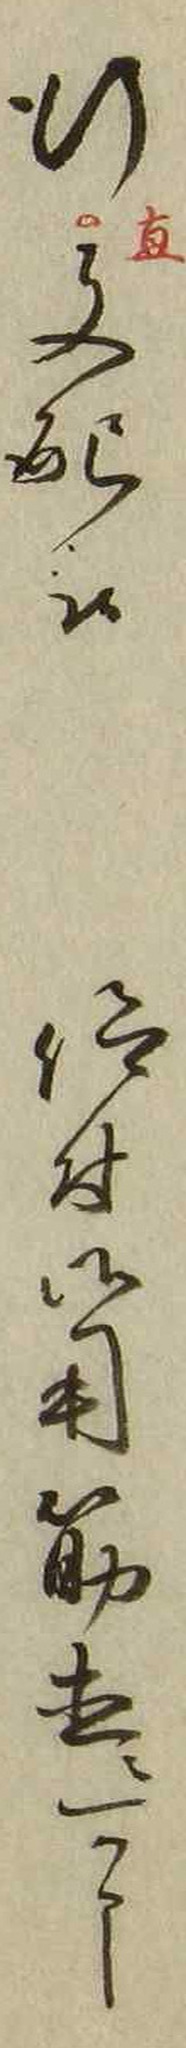行◦支配被仰付御用筋直ニ可申
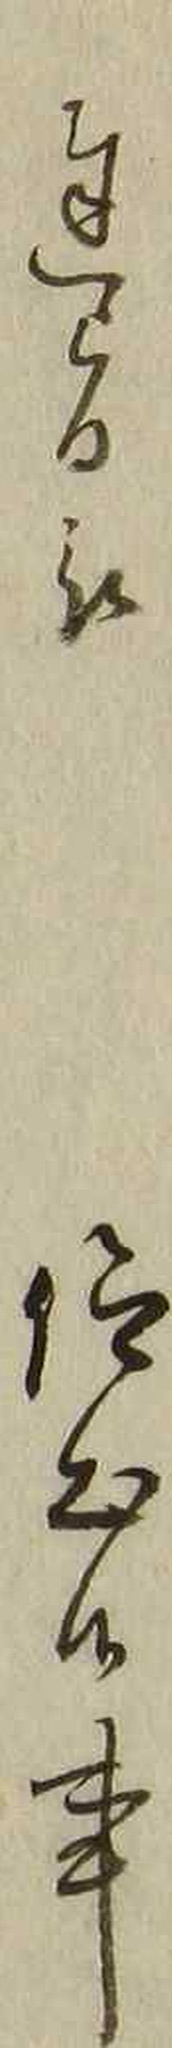達旨被仰出候事
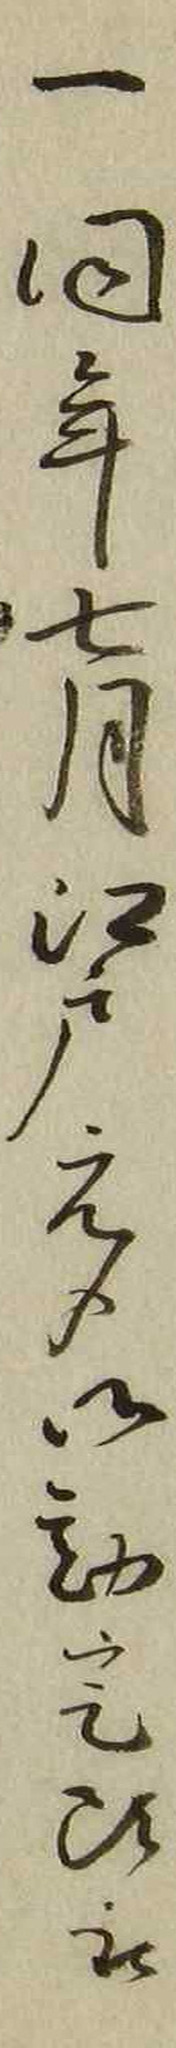一同年七月江戸元〆御勘定頭被
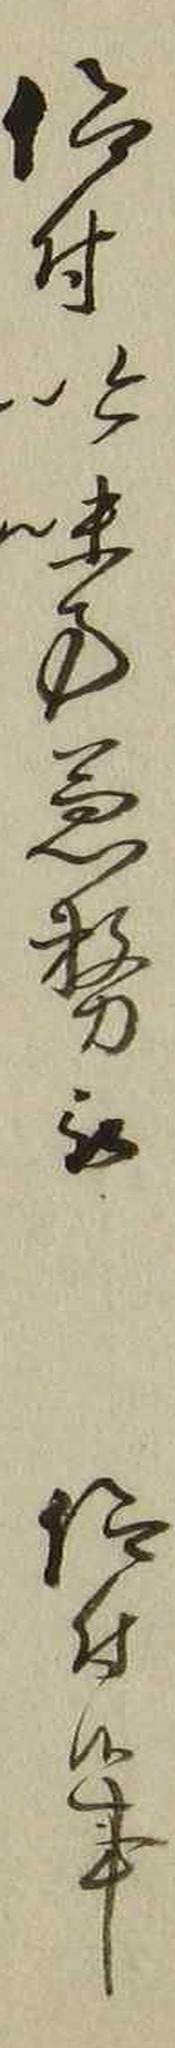仰付吟味方兼務被仰付候事
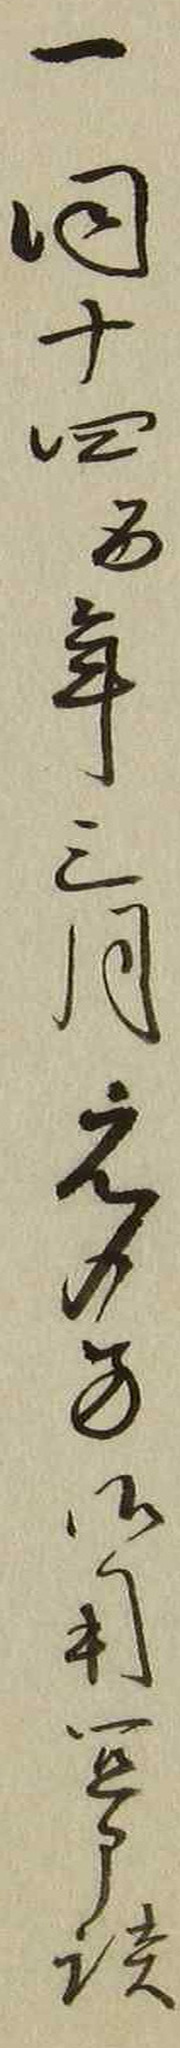一同十四酉年三月元〆方御用宜申談
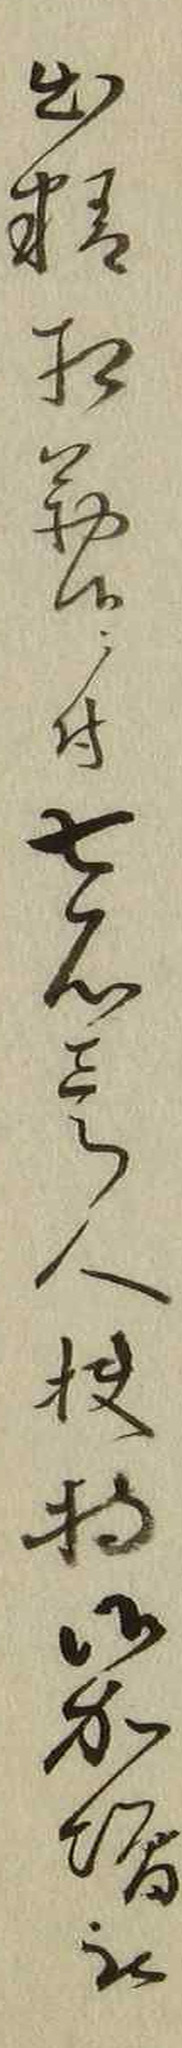出精相勤候ニ付七石壱人扶持御加増被
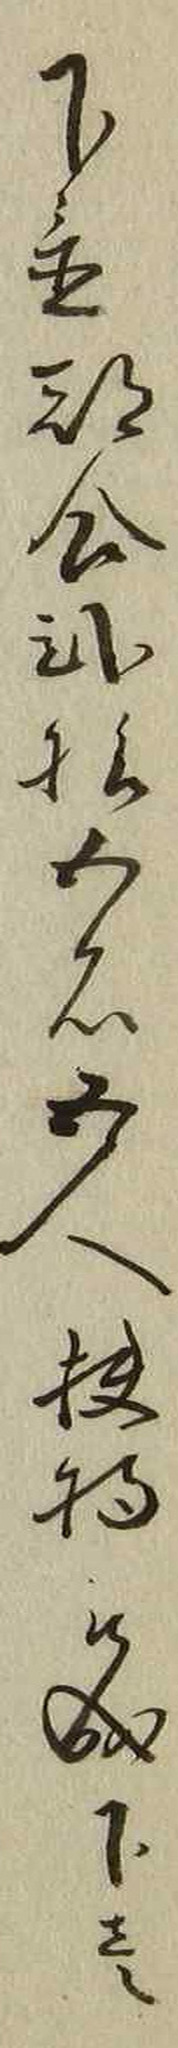下置都合弐拾五石五人扶持被成下壱
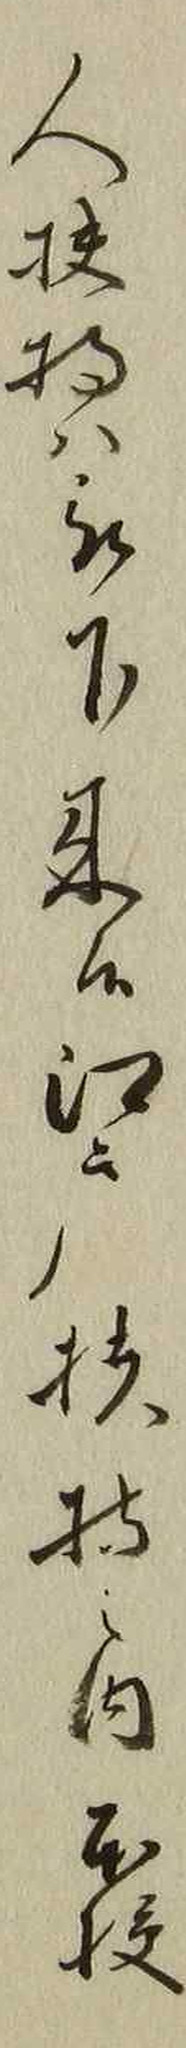人扶持ハ被下来候江戸扶持之内本扶
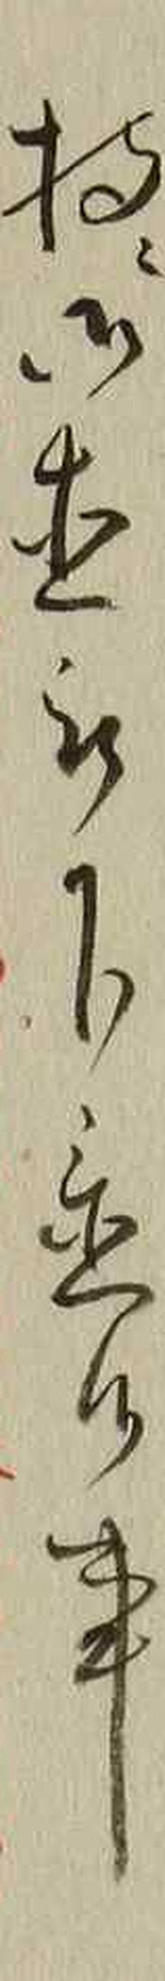持ニ御直被下置候事
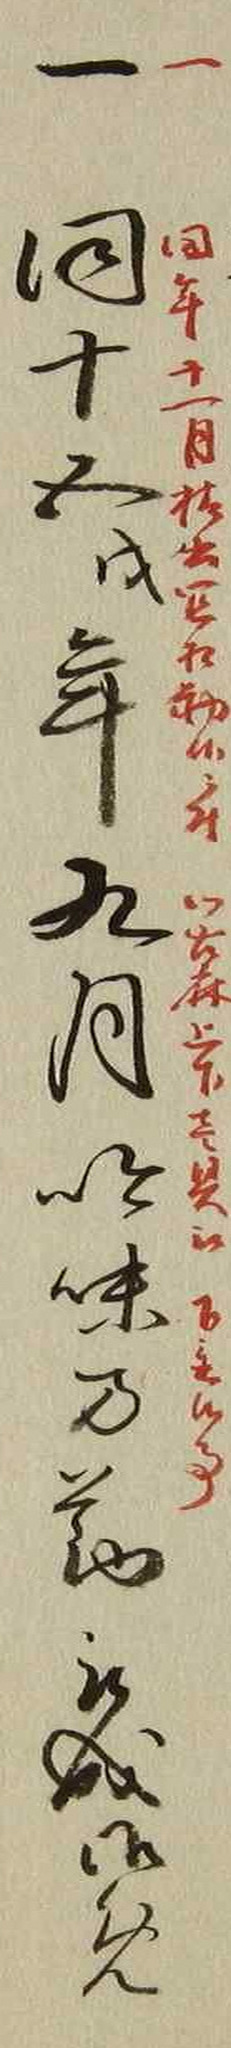一同十五戌年九月吟味方勤被成御免
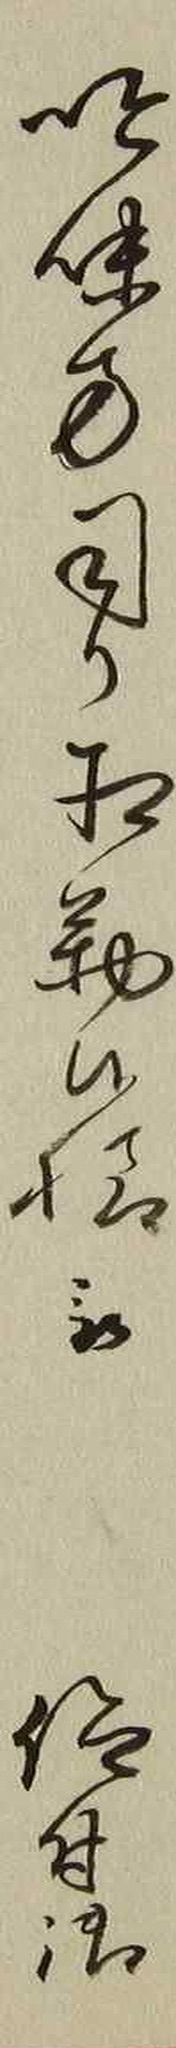吟味方司り相勤候様被仰付御
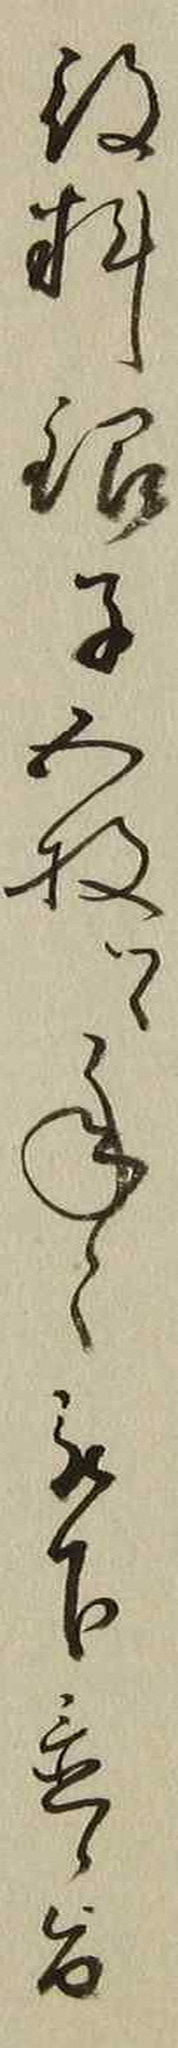役料銀子五枚ツヽ年々被下置候旨
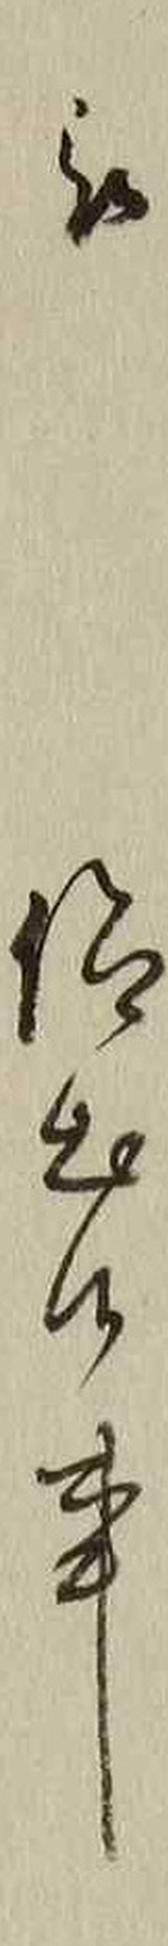被仰出候事
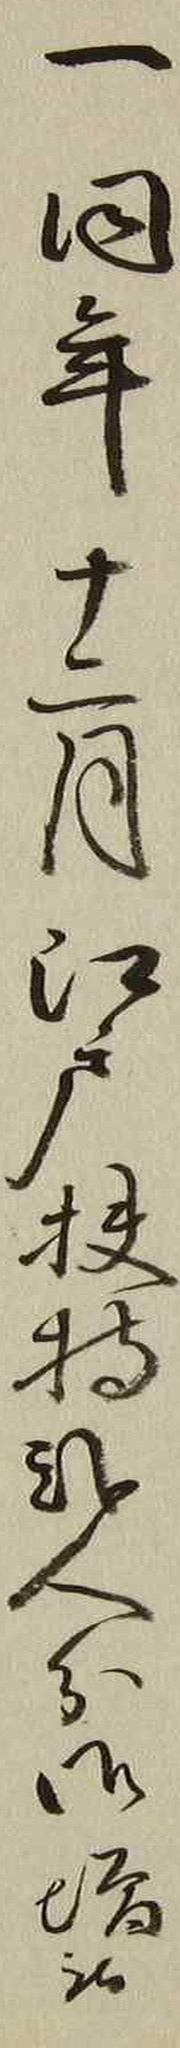一同年十二月江戸扶持弐人分御増被
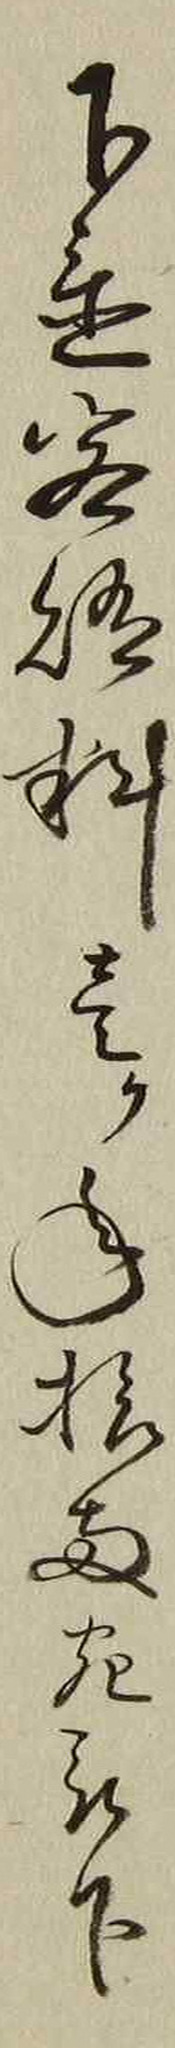下置客賄料壱ケ年拾両宛被下
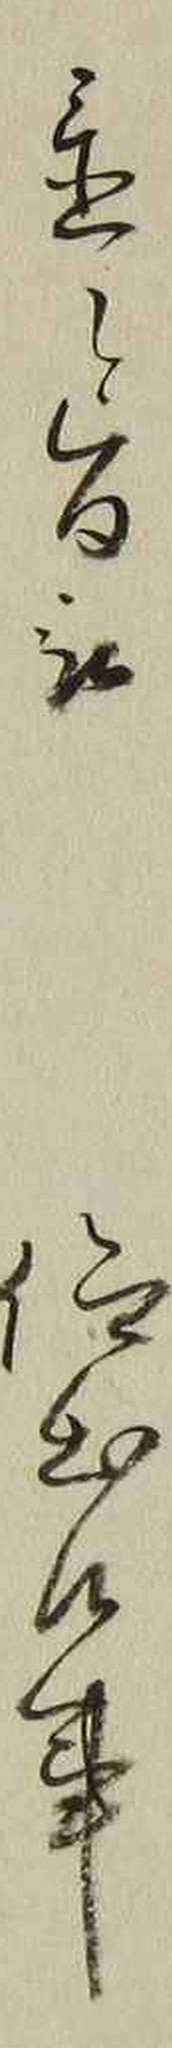置候旨被仰出候事
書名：諸士系譜　巻之4　い之部4
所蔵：会津若松市立会津図書館
